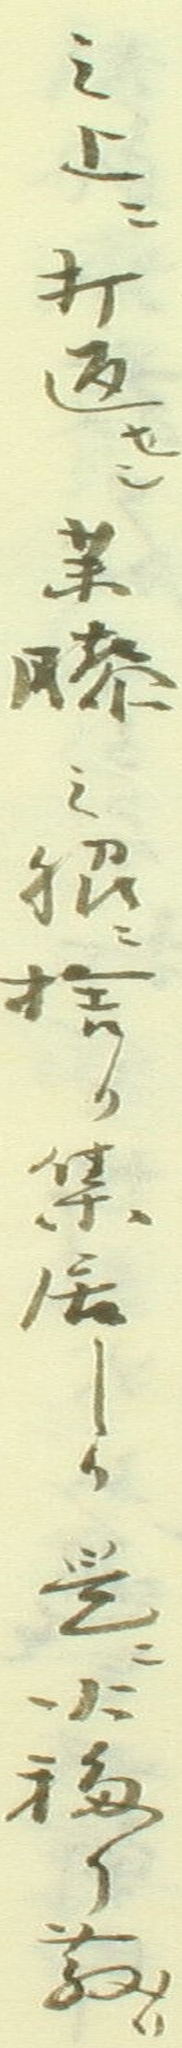之上に打返せし薬膝之脇に捨り集居しり是に火移り敷は
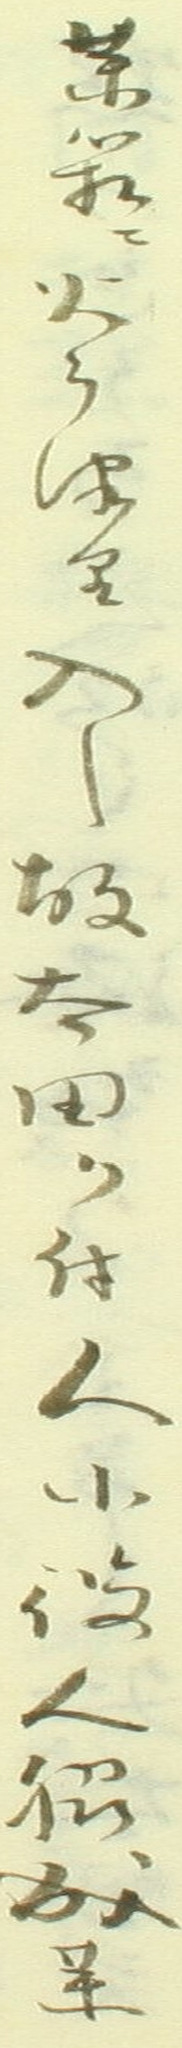薬箱に火うつり入し故太田は付人小役人脇成薬
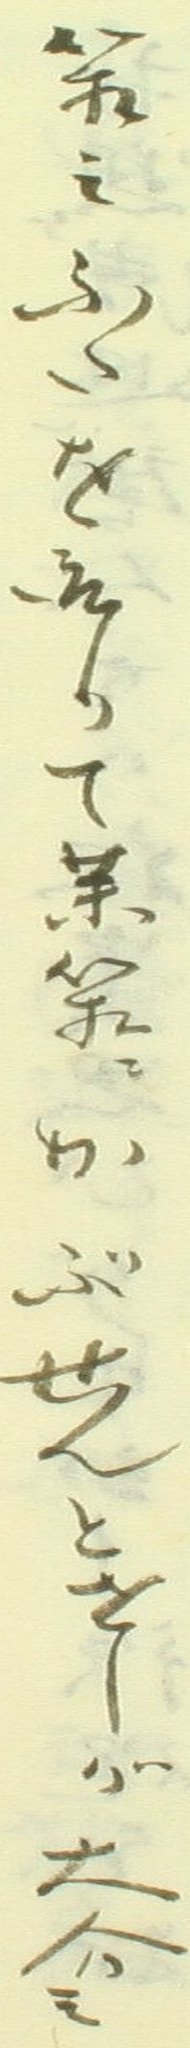箱之ふたを取りて薬箱にかぶせんとせしが大分も
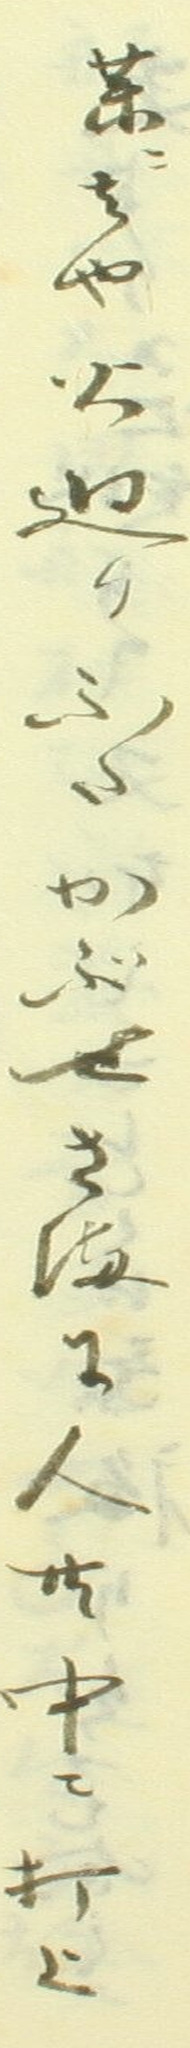薬にはや火廻りふたかぶせさるに人共中に打上
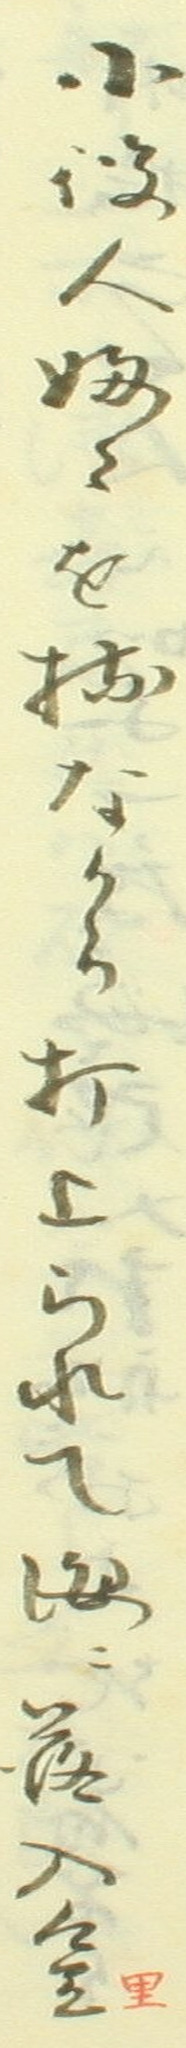小役人ふたを持なから打上られて海に落入け里
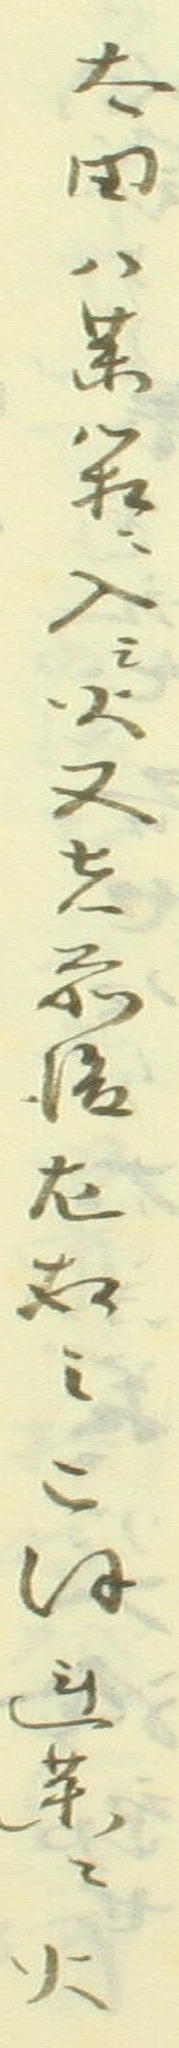大田は薬箱に入し火又者前後左右之こほれ薬に火
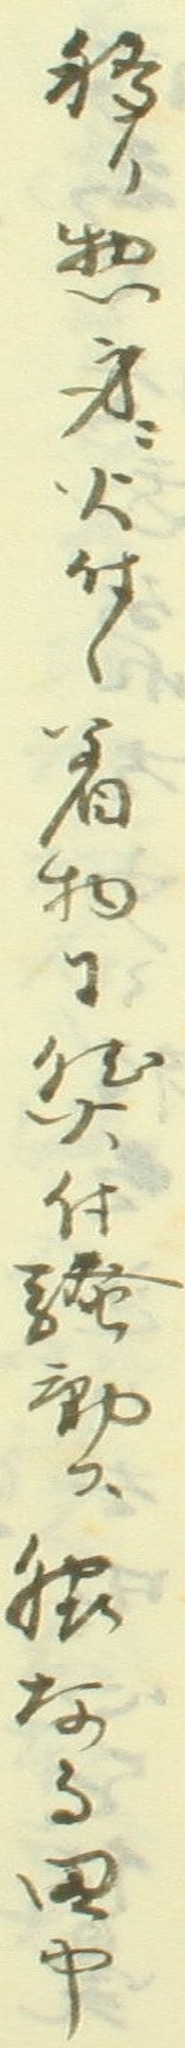移り惣身に火付く着物に？付験動す脇なる田中
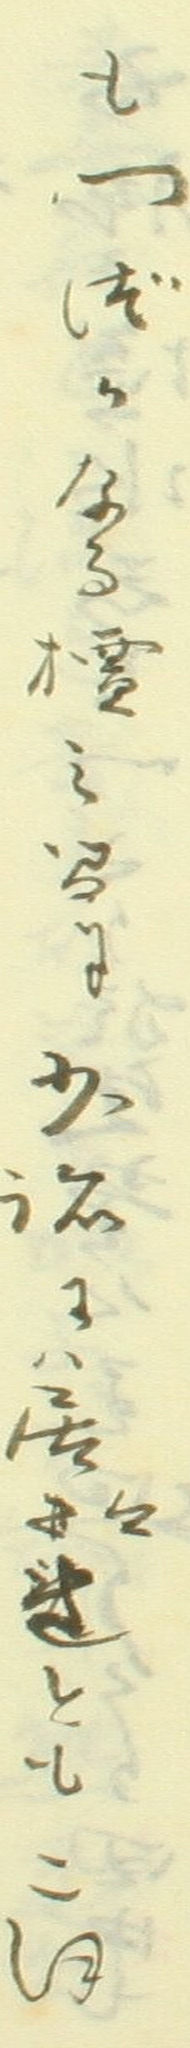もつづかなる檟之間に少諸には居け連ともこほ
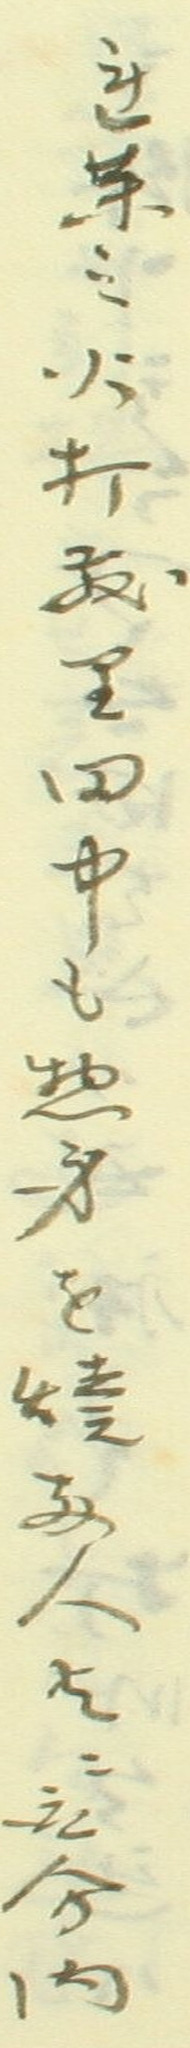れ薬之火打敷り田中も惣身を焼両人共に取分内
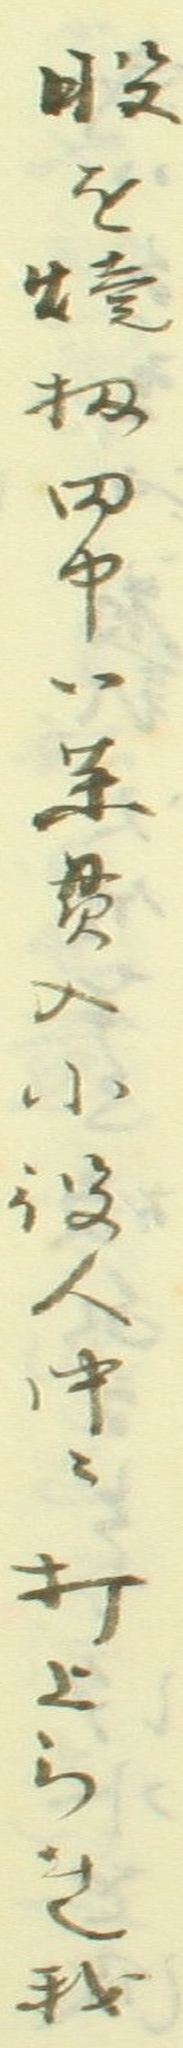股を焼扨田中は薬貫入小役人中々打上られ我
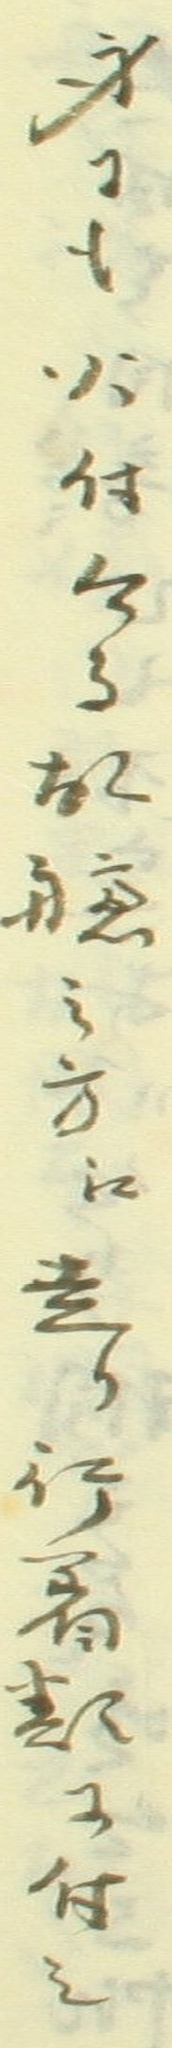身にも火付ける故？之方江走り行着類に付し
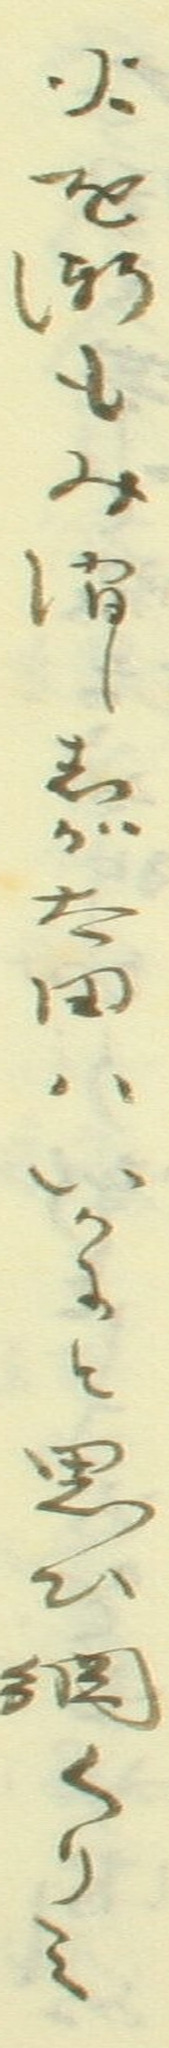火を漸もみ消ししが太田はいかにと思ひ綱くり之
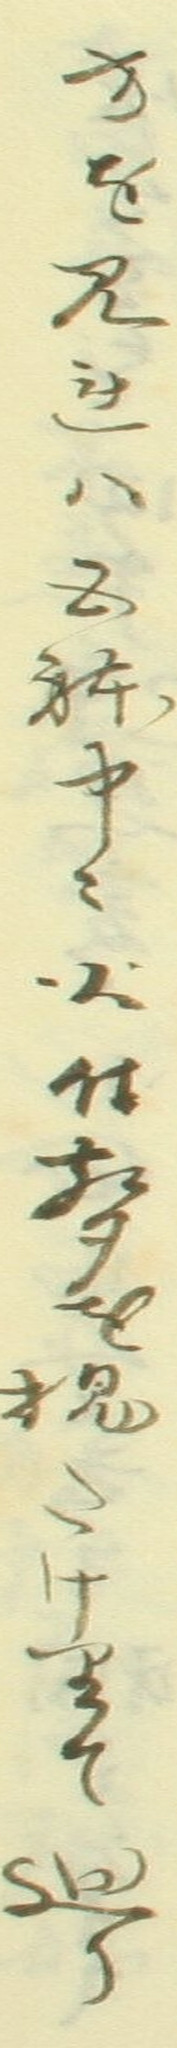方を見れは五躰中々火付声を揚たけりて廻り

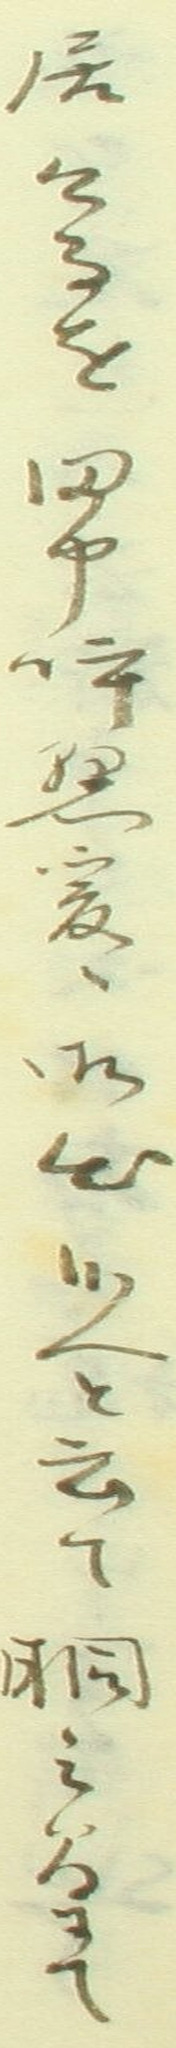居けるを田中呼懸爰に御出候へと云て之間にて
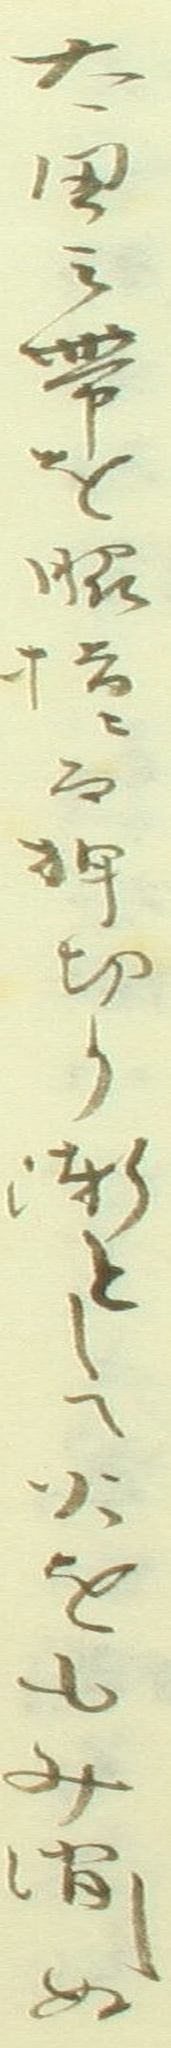大田之帯を脇指にて押切り漸として火をもみけしぬ
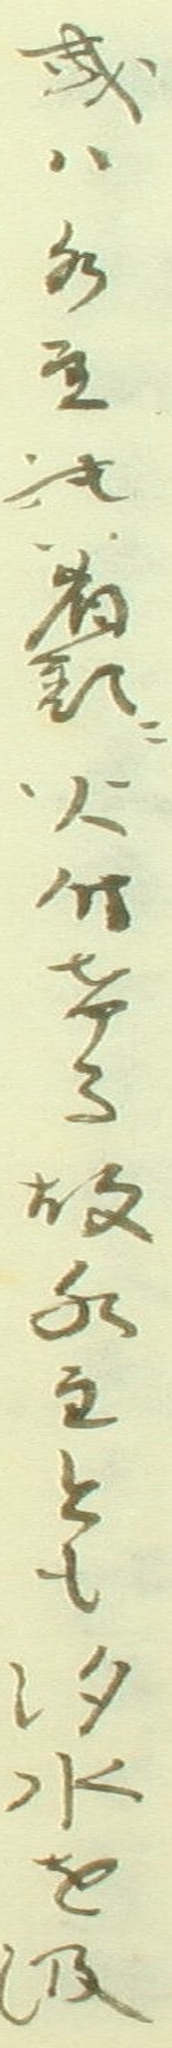或は水主能い着類に火付ける故水主とも汐水を汲
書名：唐船漂流記 三
